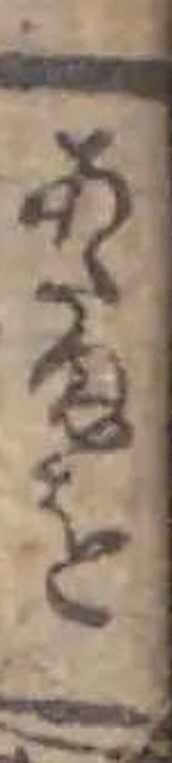あたまを
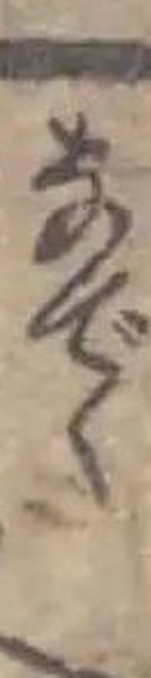なでゝ
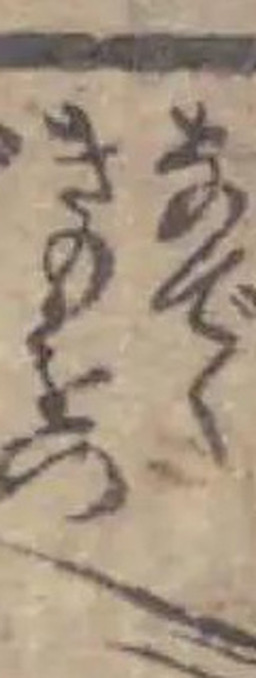きもをつ
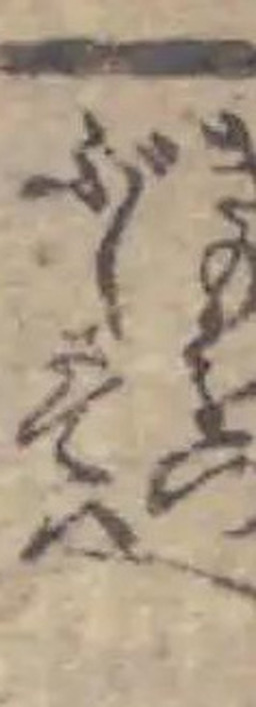ぶしさては
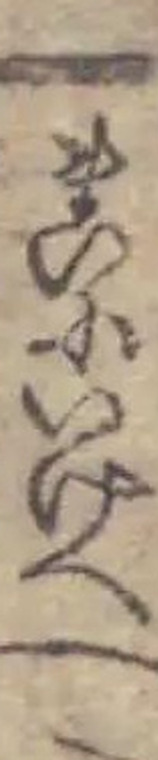まいにいけへ
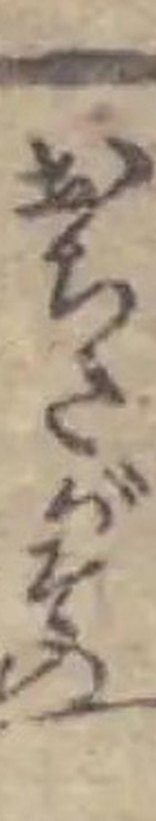おちたがその
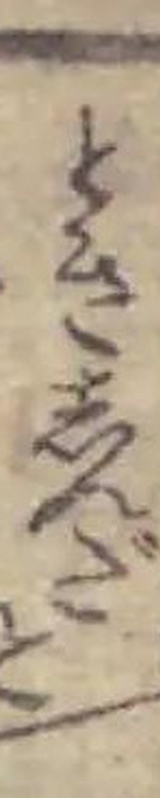ときしんだと
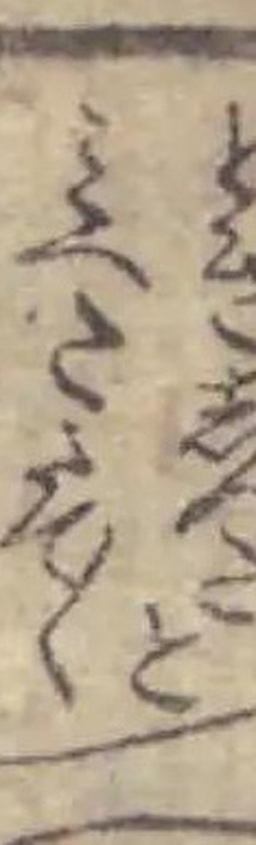みへたさて〳〵
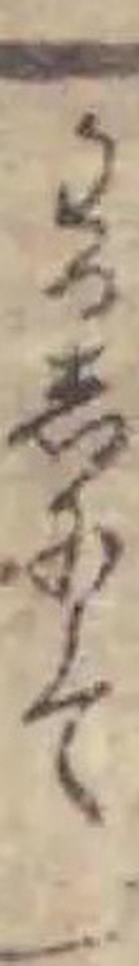わかしにして
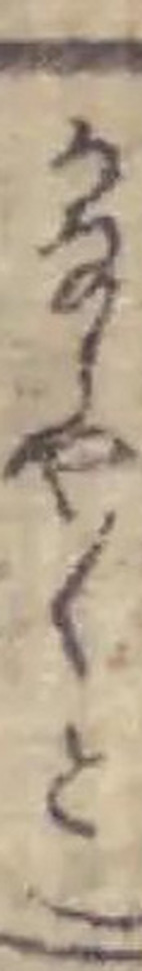かなしや〳〵と
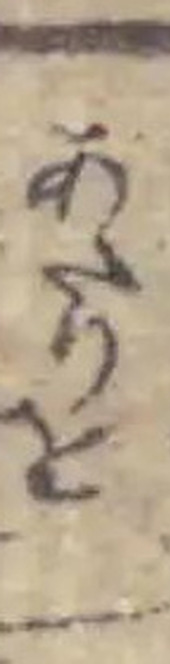あたりを
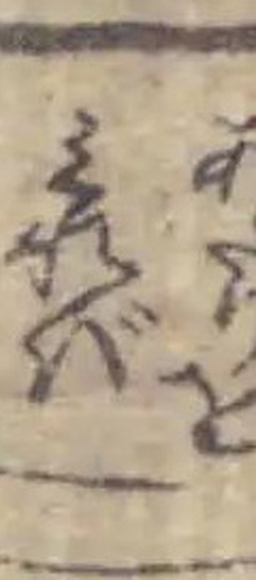みれば
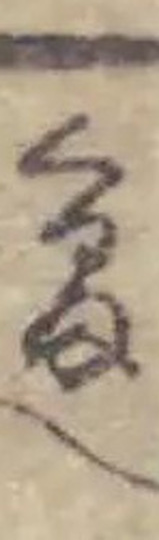くるま
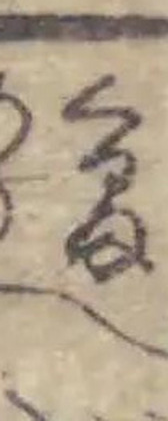くるま
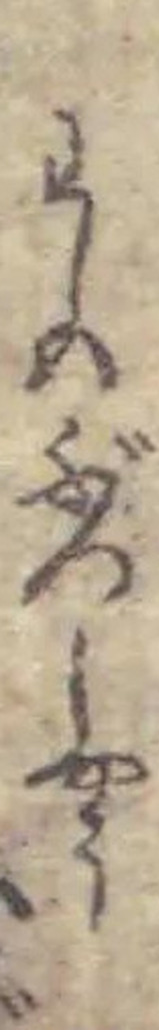わしのぶつしやう
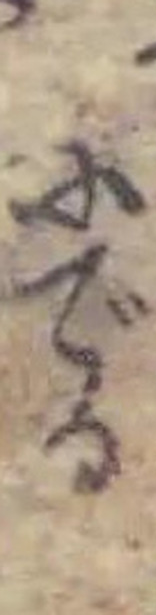にでる
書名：飲中八人前 3巻
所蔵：国立国会図書館 National Diet Library, JAPAN
